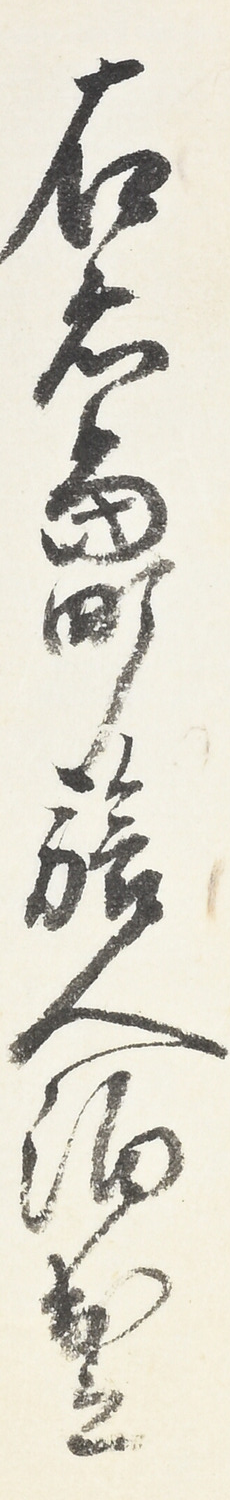右者当町旅人泊出立
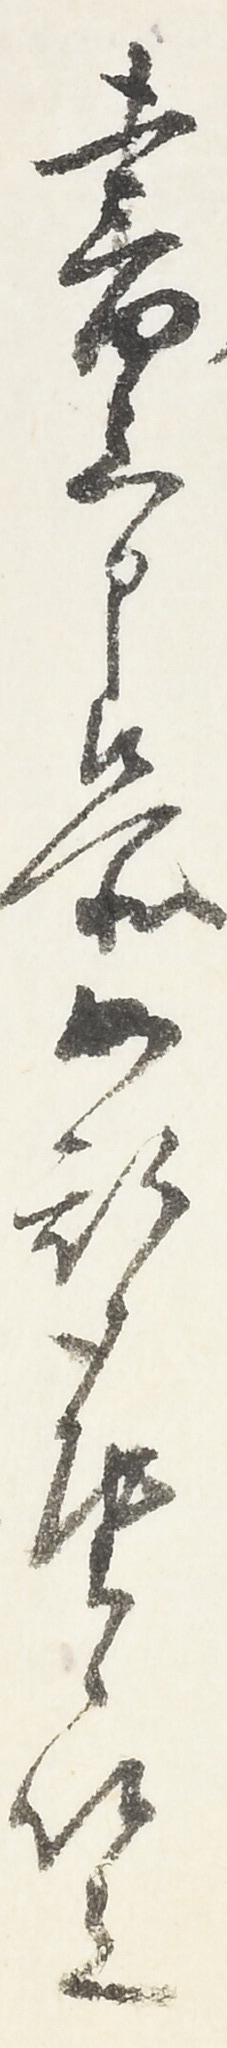書上申候所如斯御座候以上
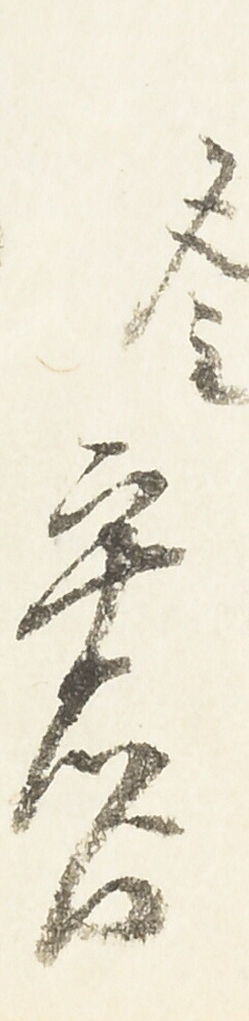平右衛門
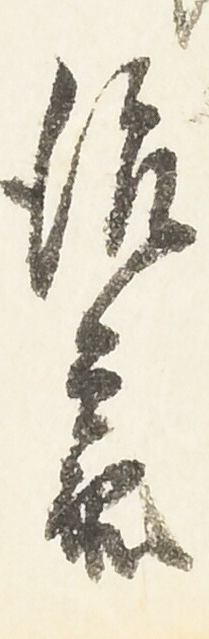治兵衛
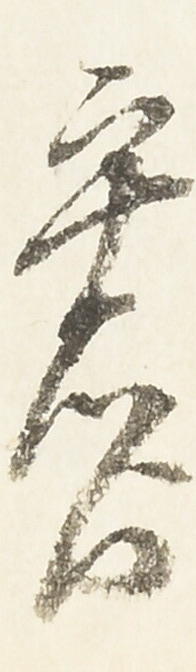平右衛門
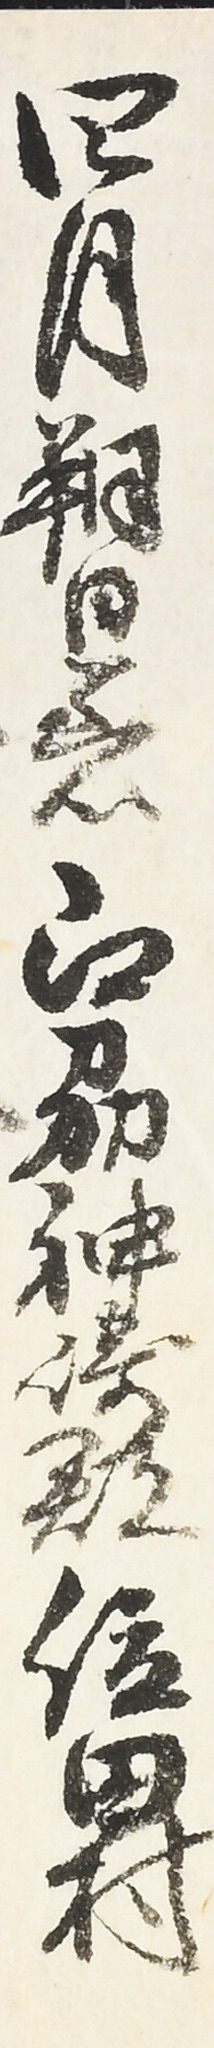四月朔日着江州神崎郡位田村
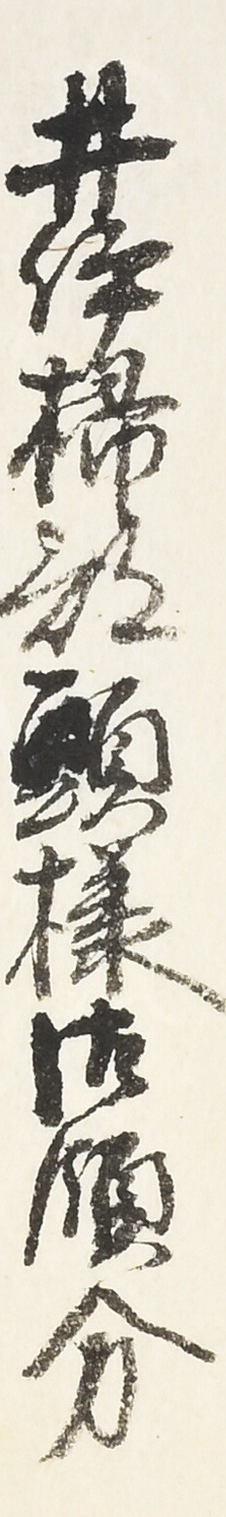井伊掃部頭様御領分
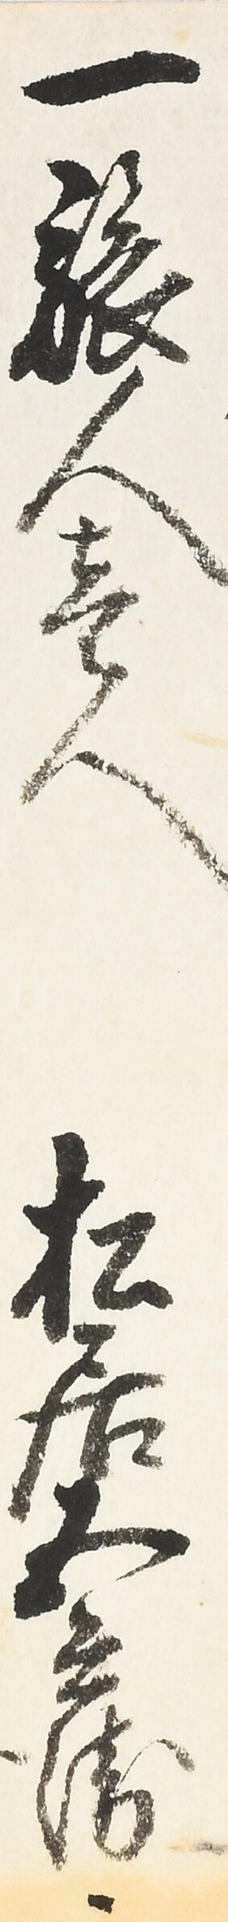一旅人壱人松居五兵衛・
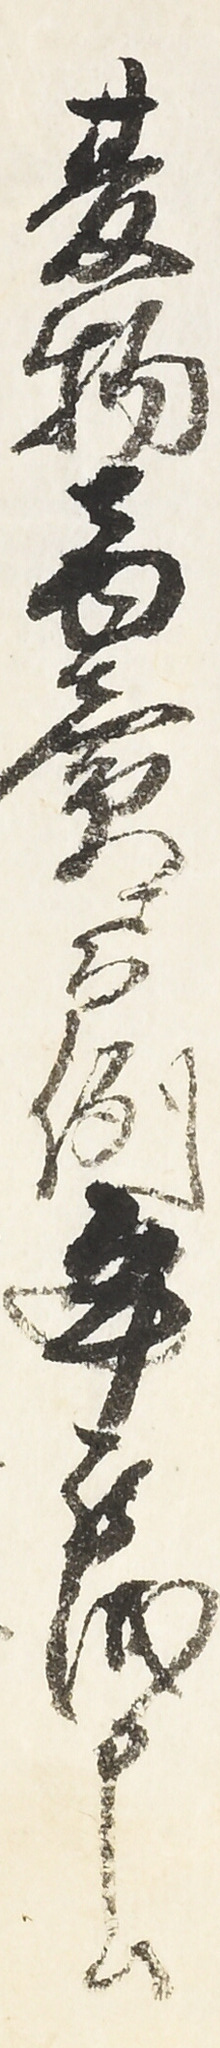夏物商売ニ而例年罷越申候
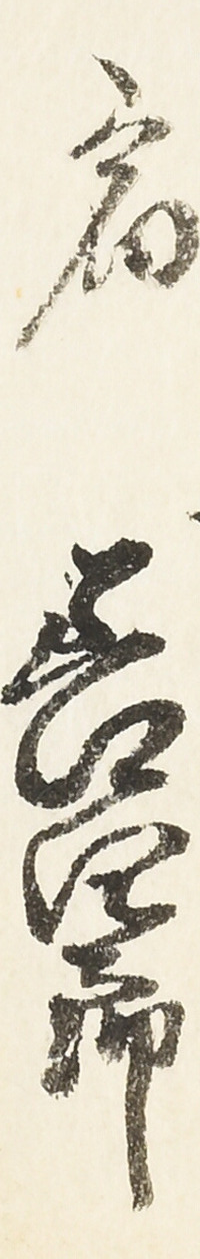宿善四郎
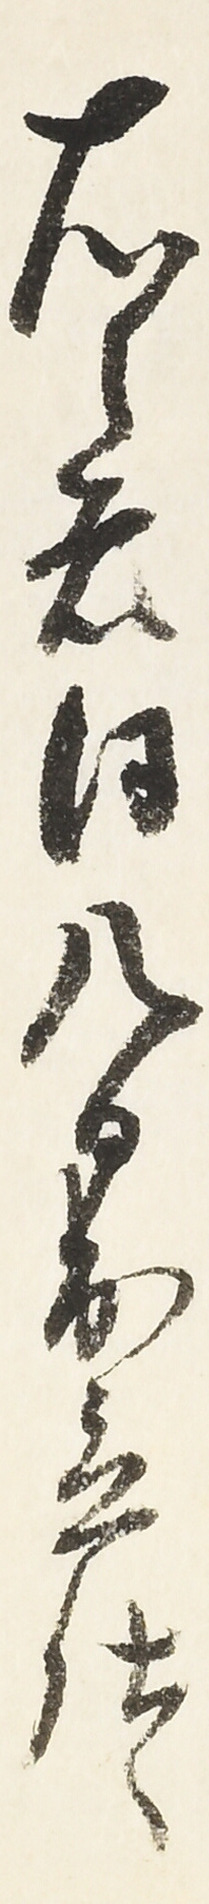右之者同八日出立仕候
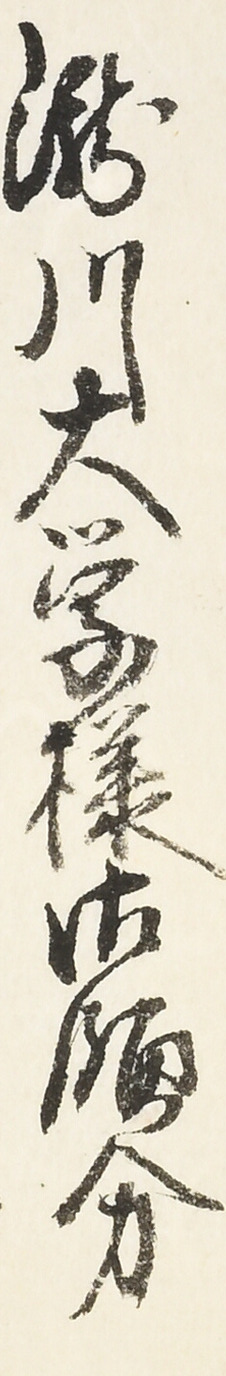瀧川大学様御領分
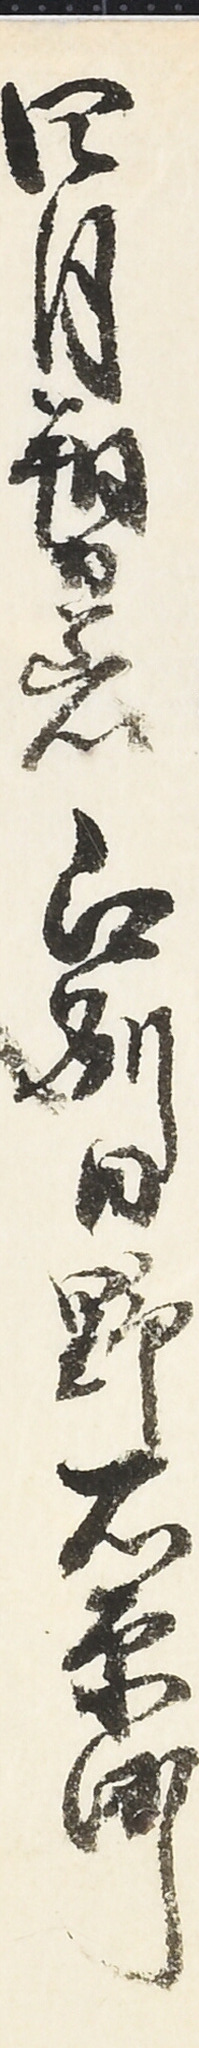四月朔日着江州日野石原町
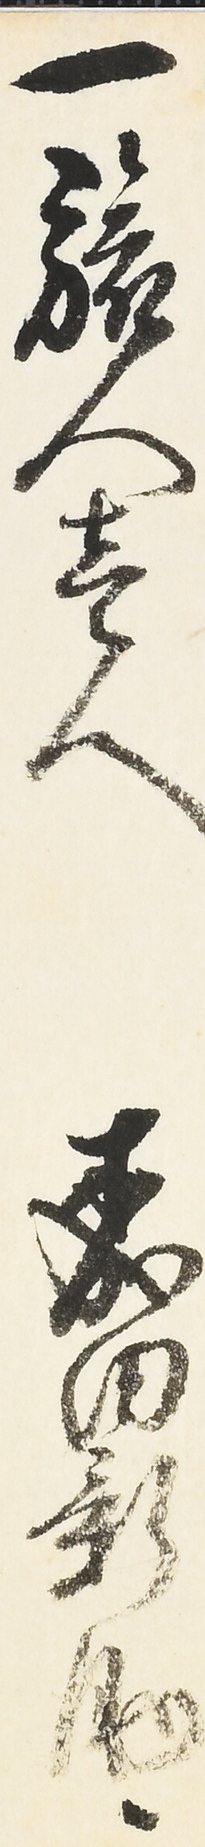一旅人壱人森田新助・
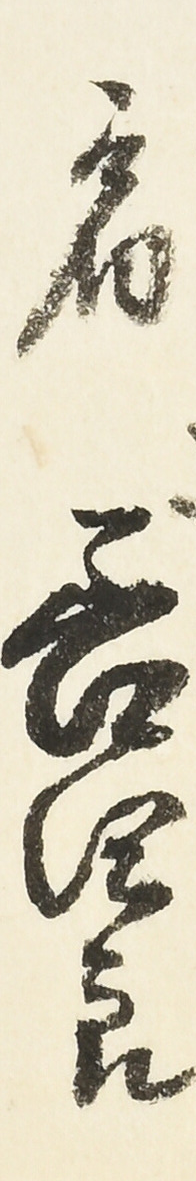宿善四郎
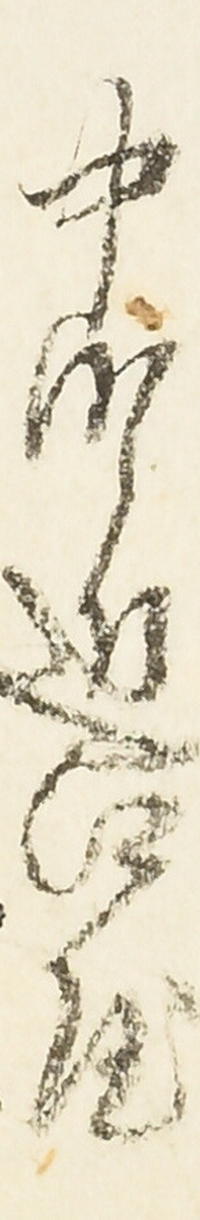中町近江屋
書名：町中旅人泊控帳
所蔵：伊那市立高遠町図書館・合同会社AMANE
